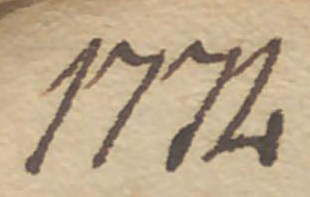1774
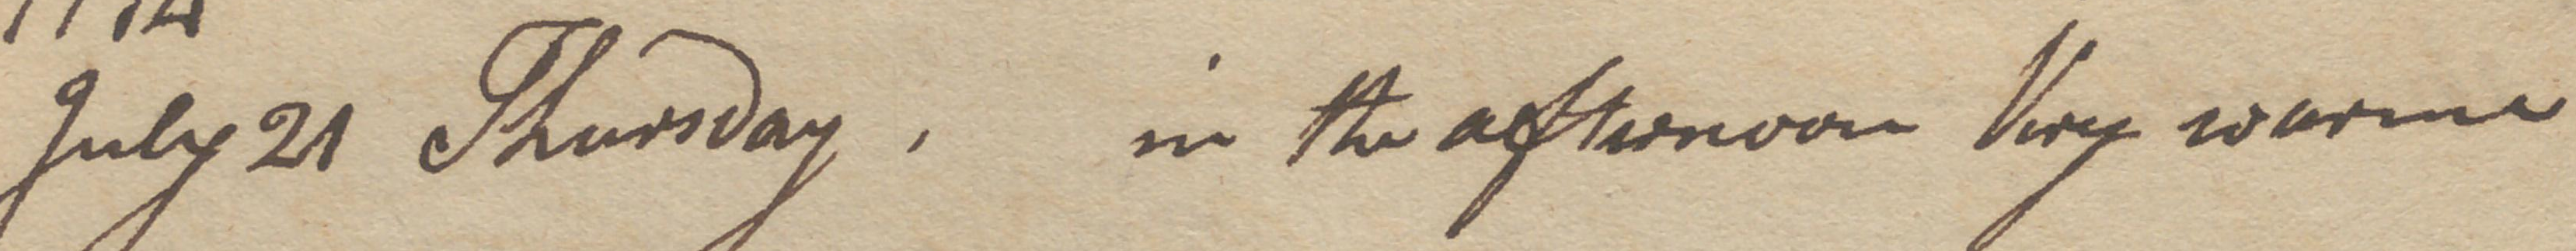July 21 Thursday, in the afternoon Very warme
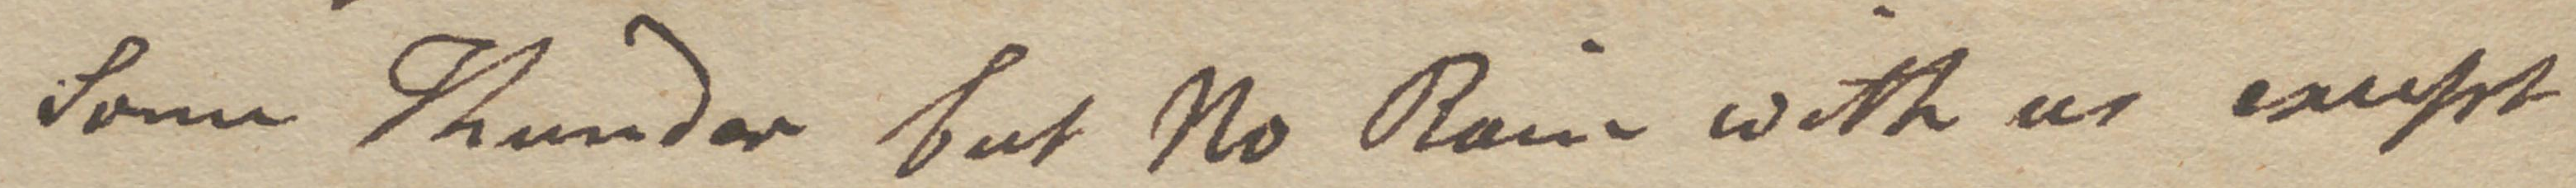some Thunder but no Rain with us except
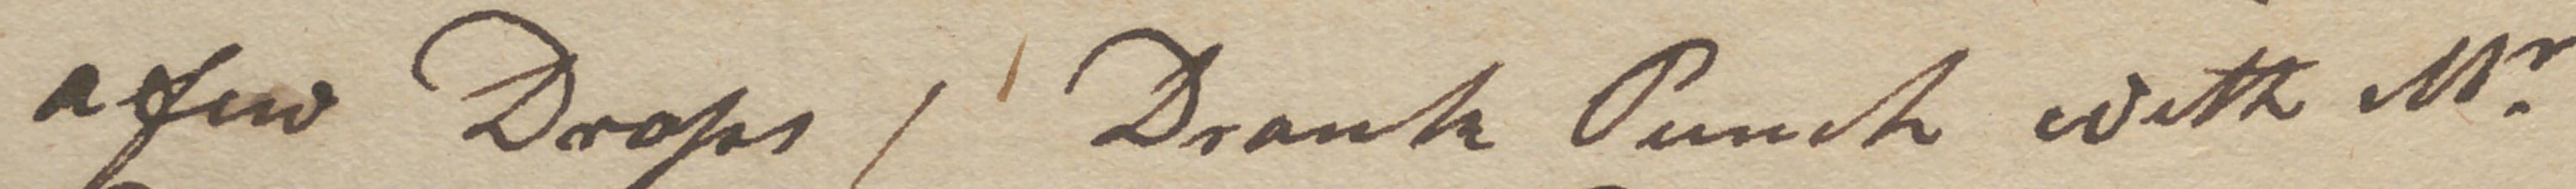a few Drops, Drank Punch with M^r.
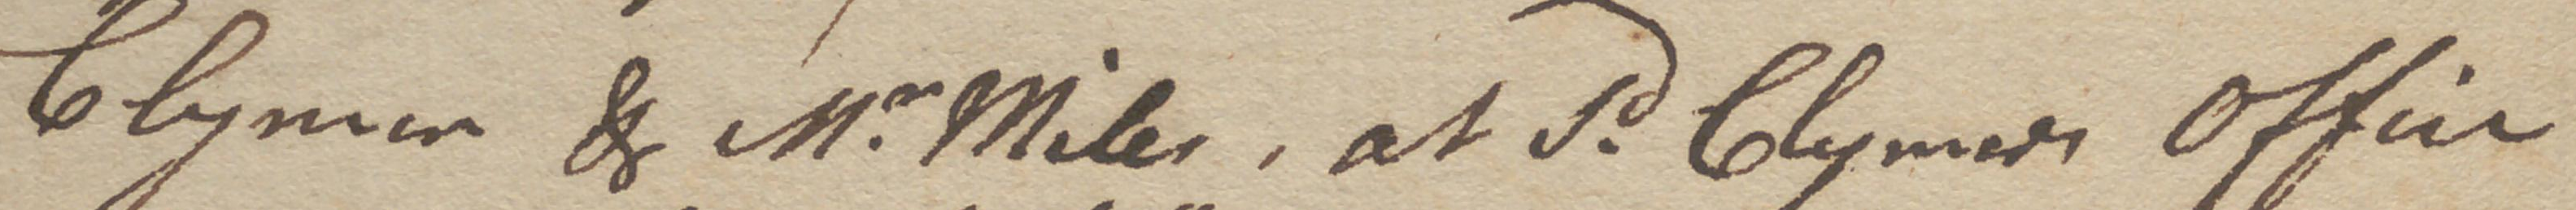Clymer & M^r. Miles, at s^d. Clymers Office
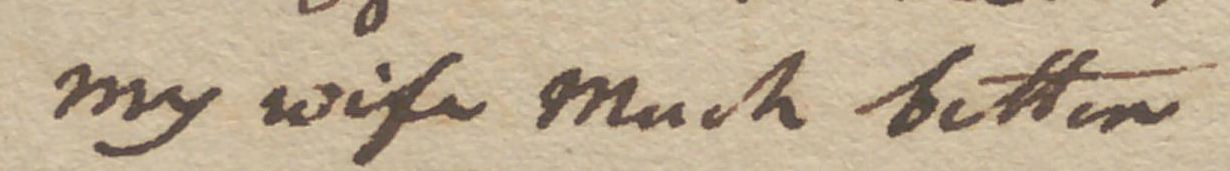my wife Much better
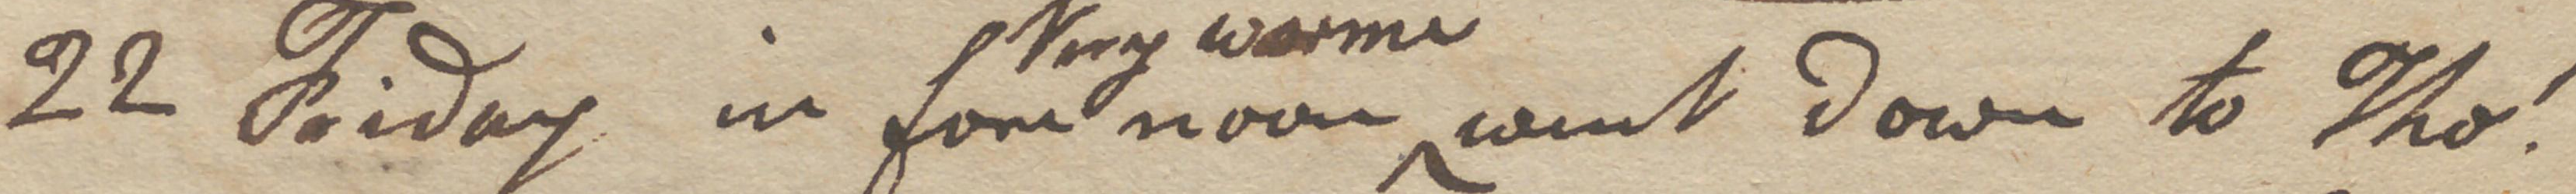22 Friday in fore noon ^ went down to Tho^s.
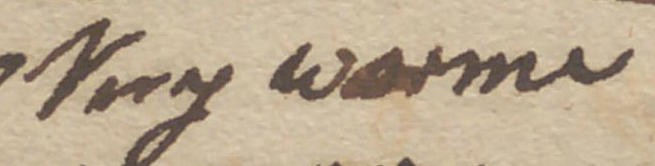Very warme
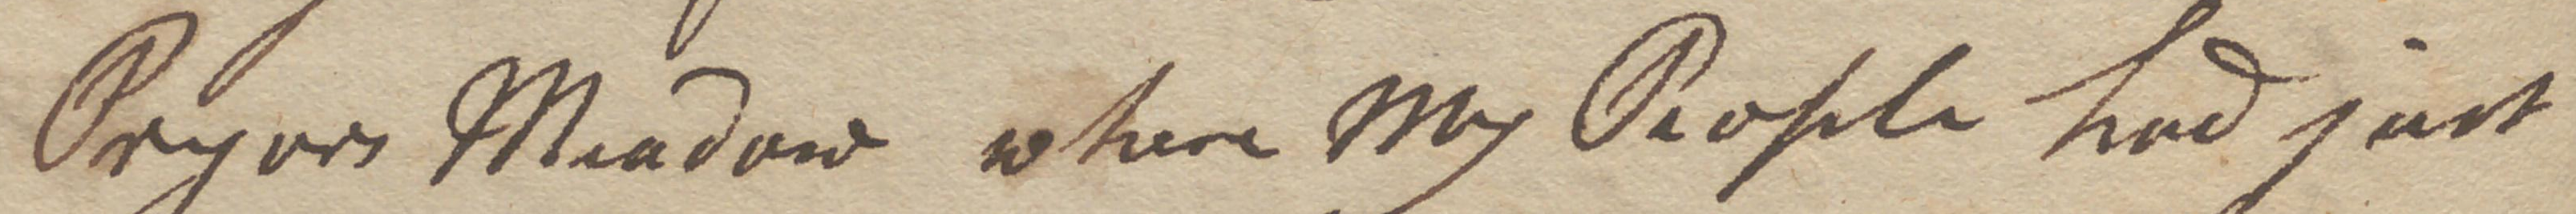Pryors Meadow where My People had just
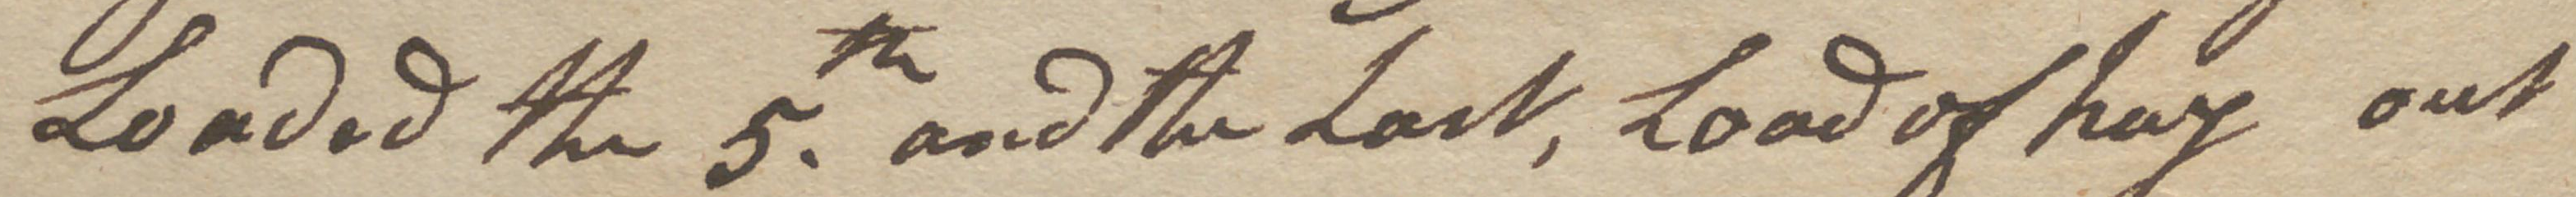Loaded the 5^th. and the Last, Load of hay out
